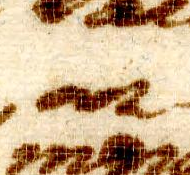not
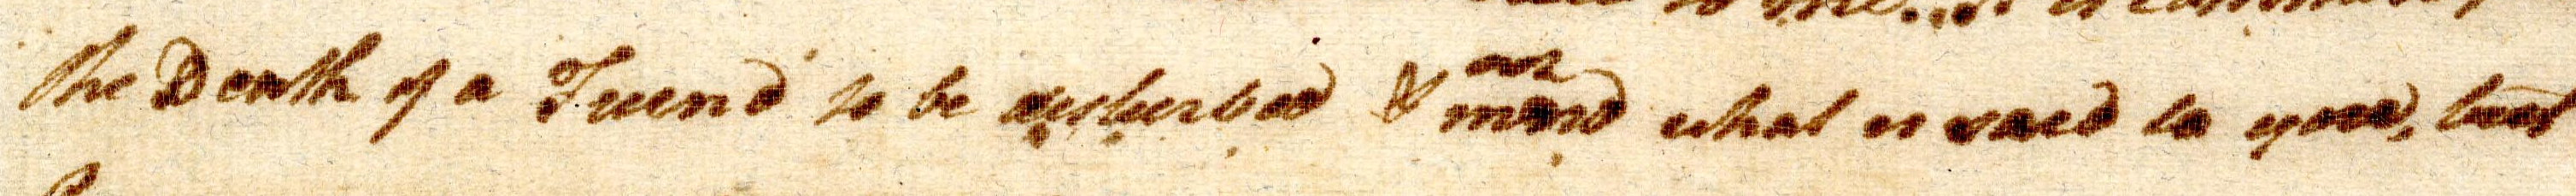the Death of a Friend to be disturbed & ^ mind what is said to you, but
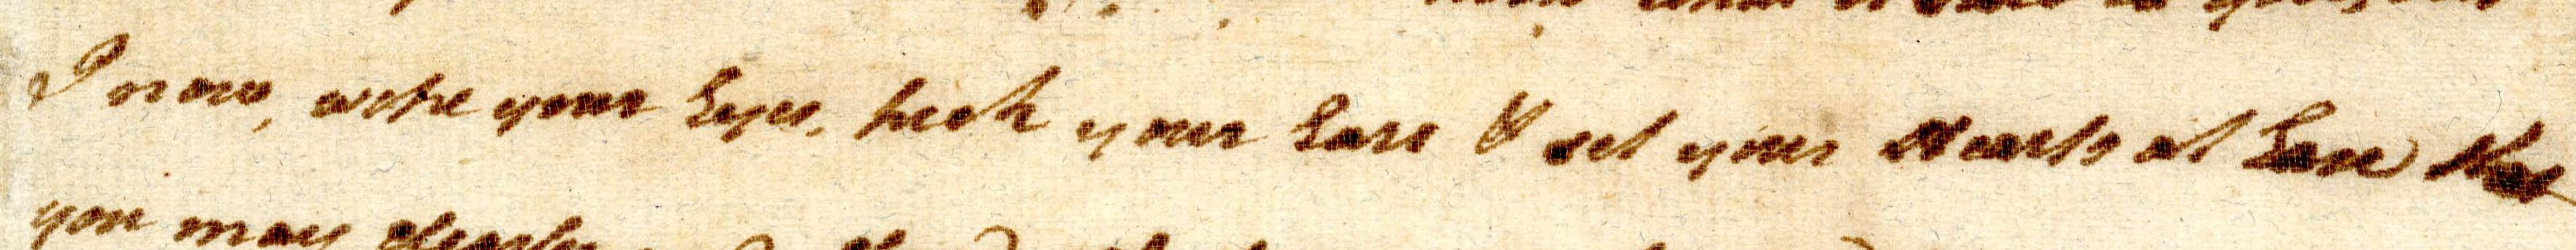I now, wipe your Eyes, pick your Ears & set your Hearts at Ease that
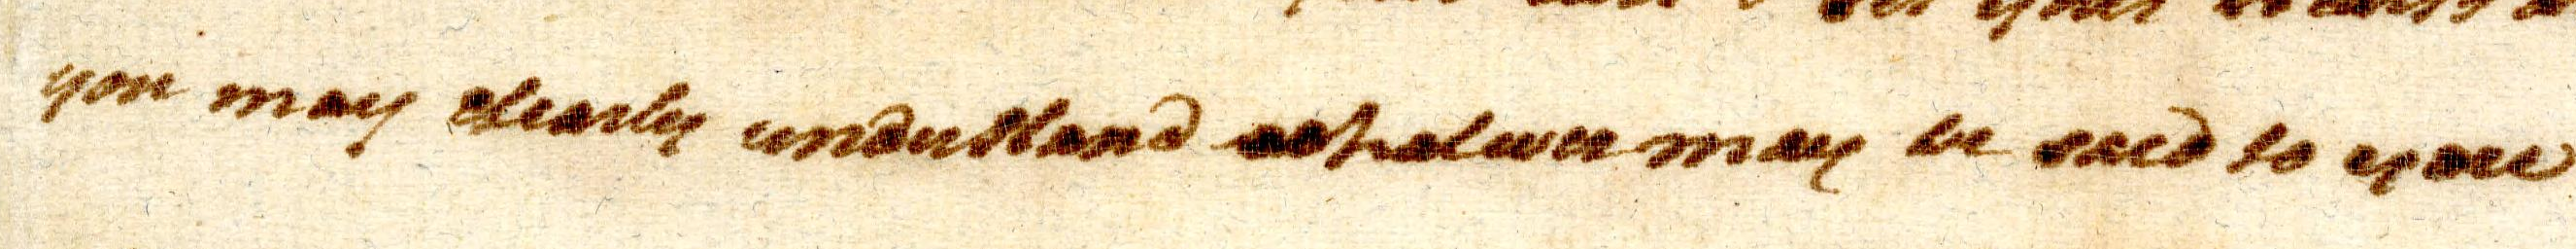you may clearly understand what ever may be said to you.
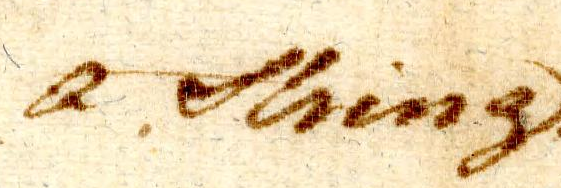A String
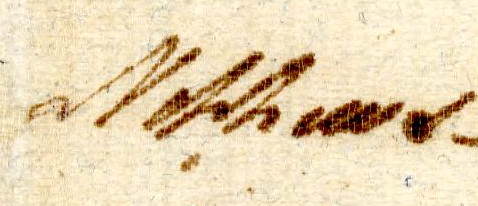Nephews
